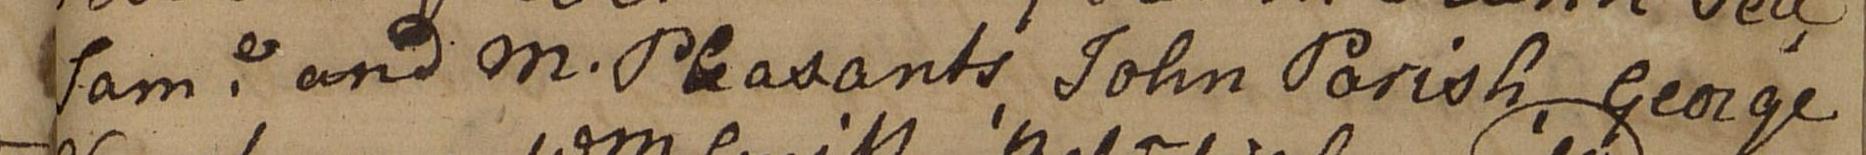Sam^l. and M. Pleasants, John Parish, George
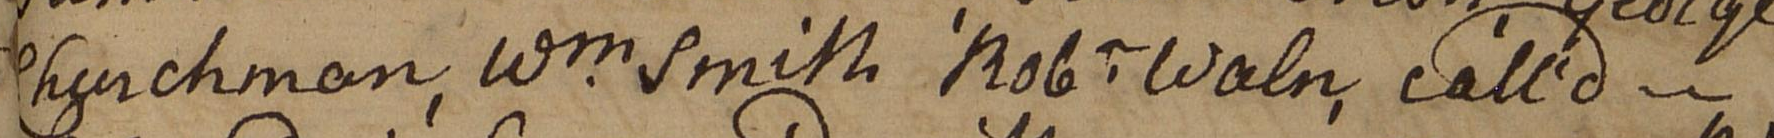Churchman, W^m. Smith Rob^r. Waln, call'd-
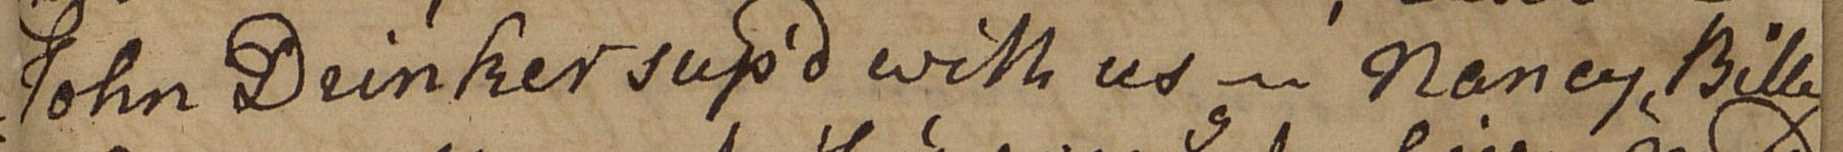John Drinker sup'd with us- Nancy Billy
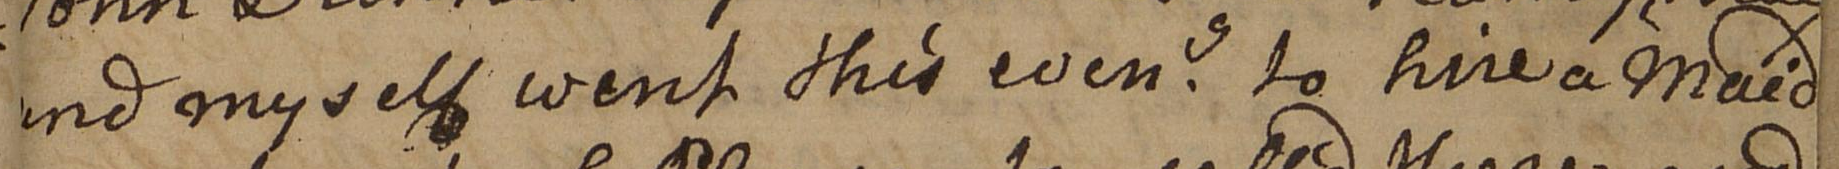and myself went this even^g. to hire a Maid
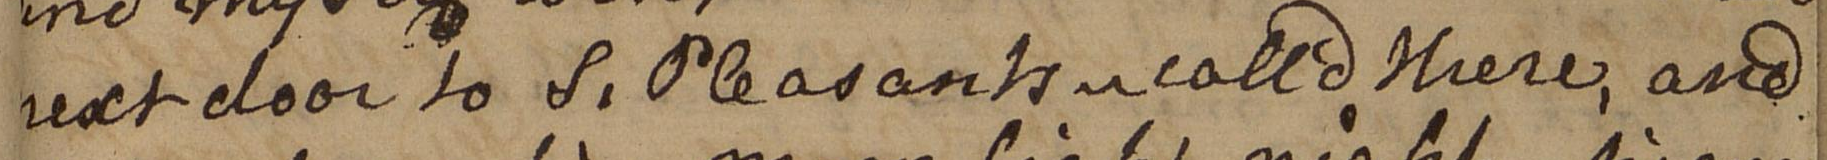next door to S. Pleasants- call'd there, and
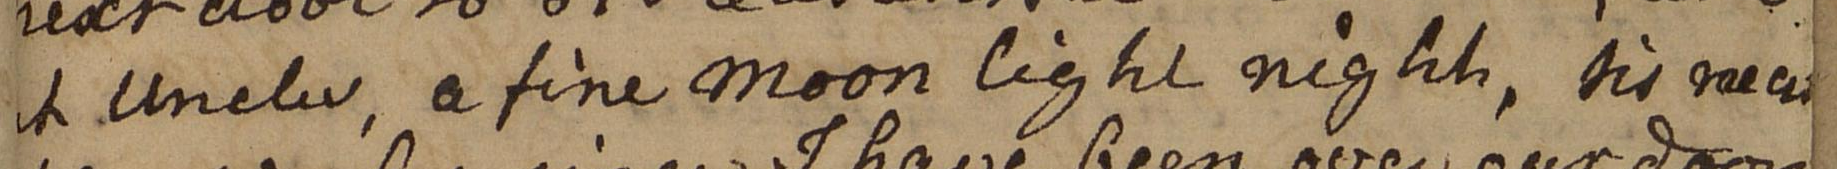t Uncle, a fine moon light night, tis nea
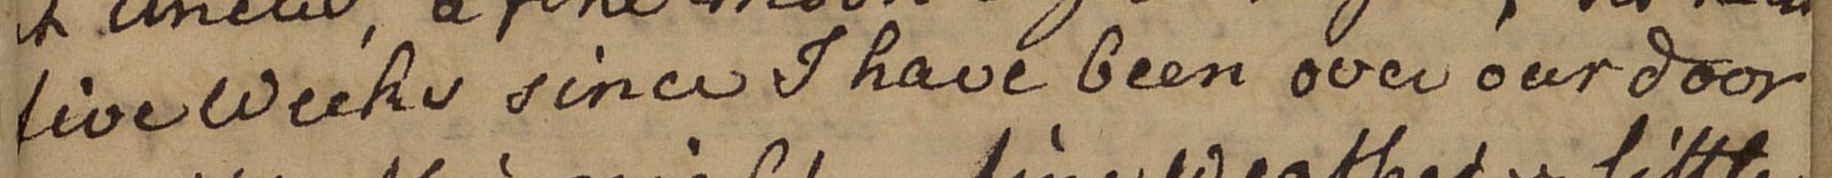five weeks since I have been over our door
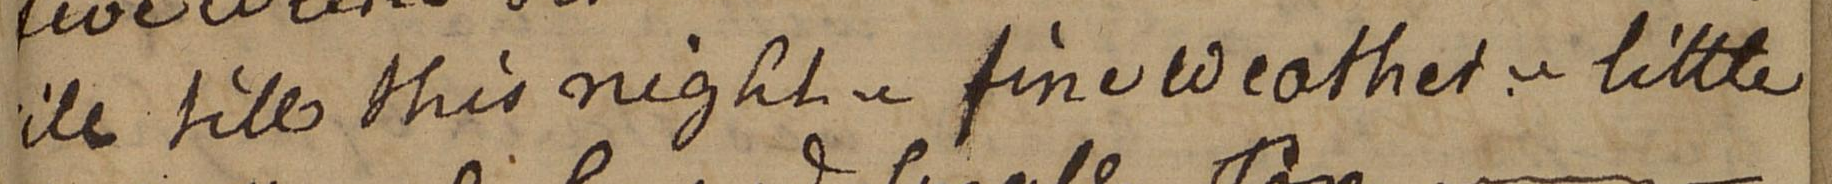ill till this night- fine weather- little
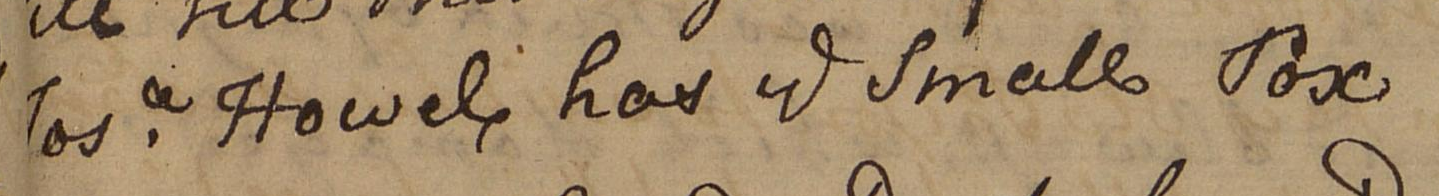Jos^a Howel has y^e Small Pox-
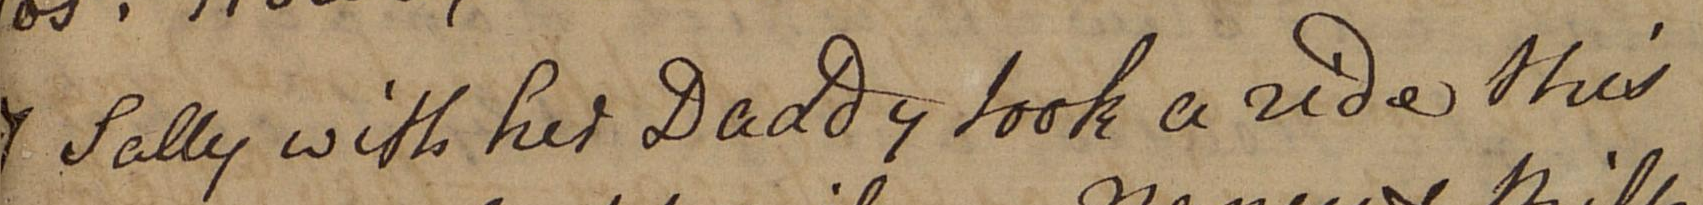7 Sally with her Daddy took a ride this
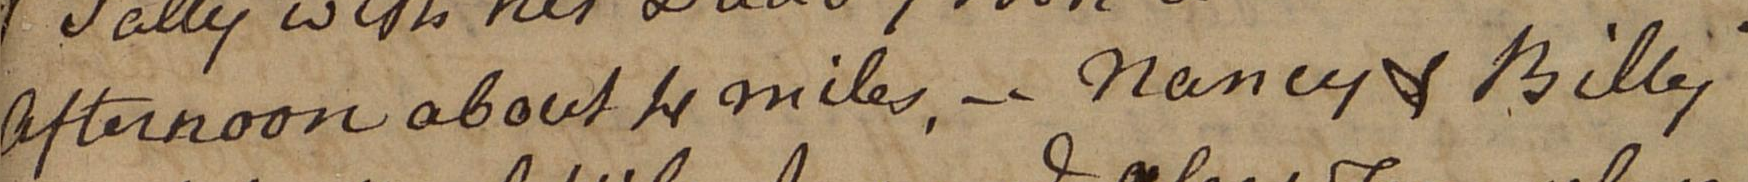afternoon about 4 miles,- Nancy & Billy
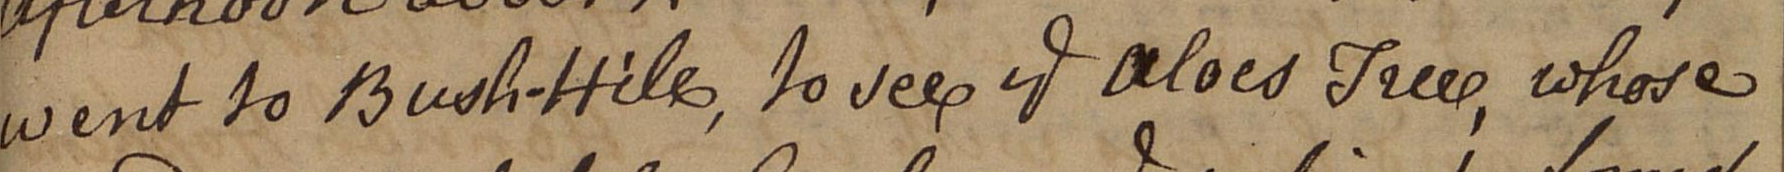sent to Bush-Hill, to see y^e Aloes Tree, whose
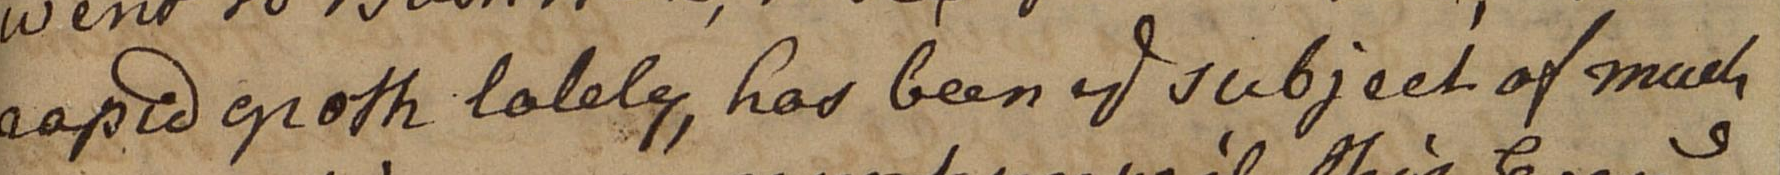rapid groth lately, has been y^e subject of much
